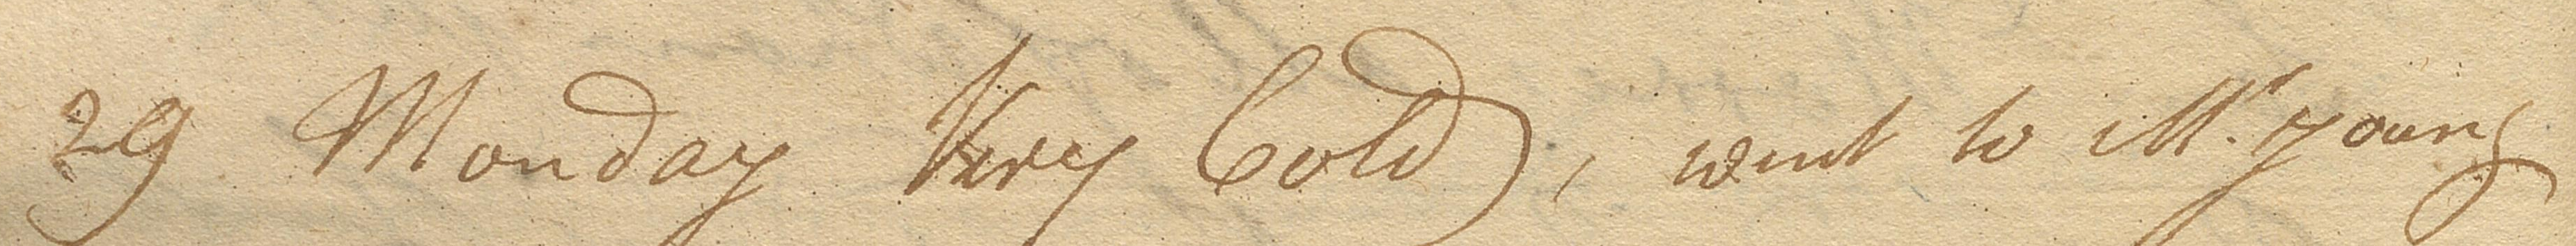29 Monday Very Cold, went to M^r young
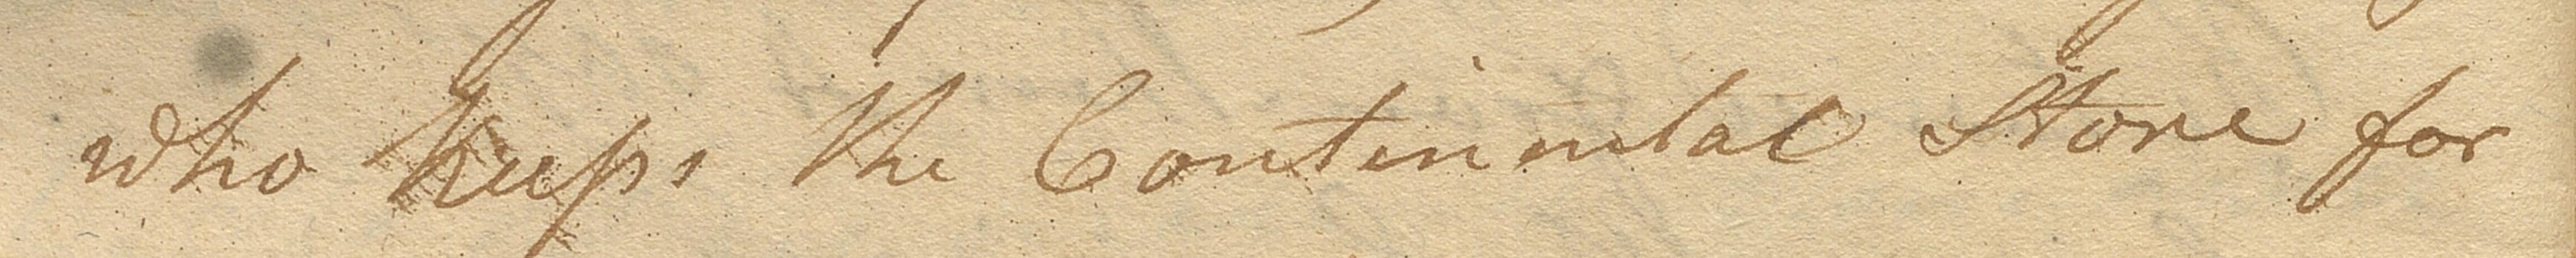who keeps the Continental Store for
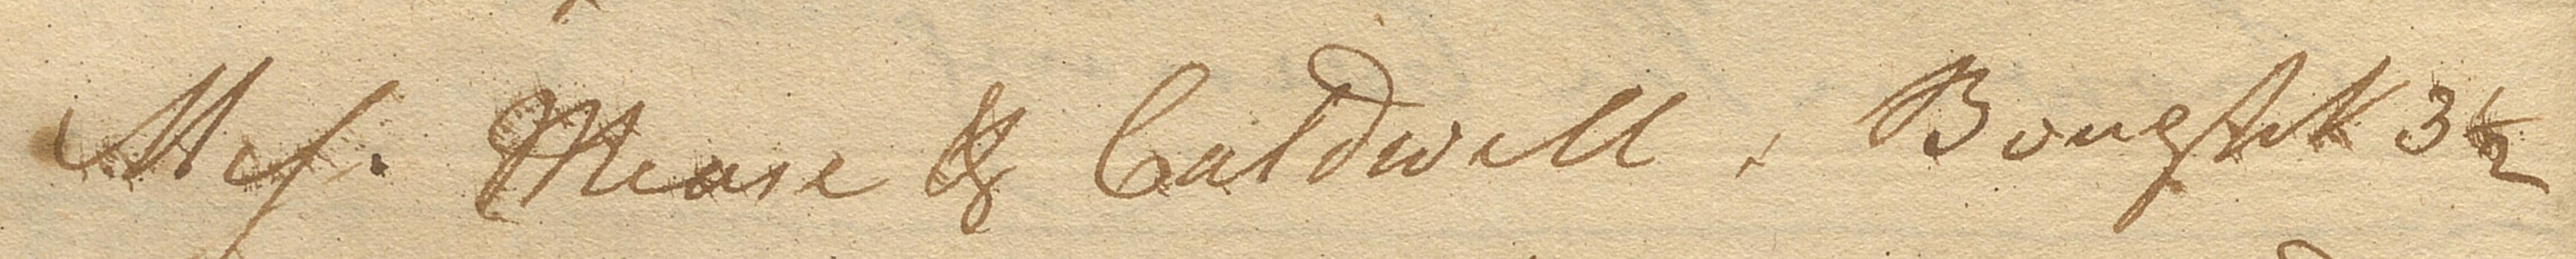Mes. Mease & Caldwell. Bought 3 1/2
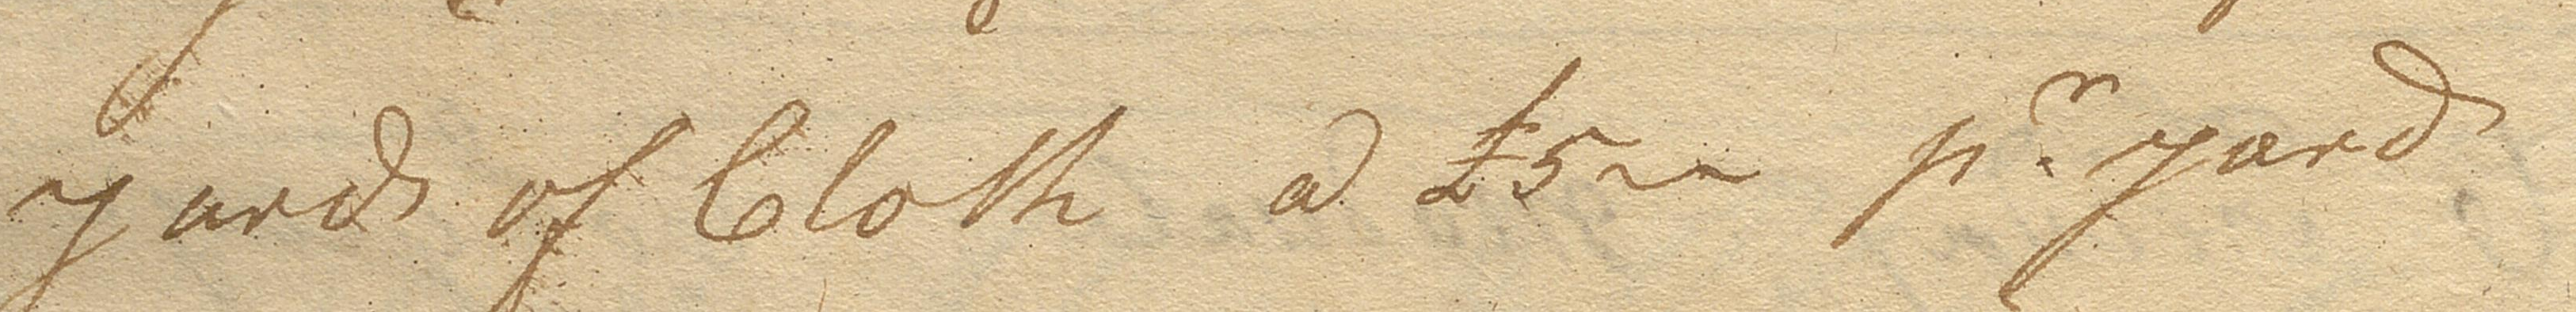yards of Cloth @ £5- p^r. yard
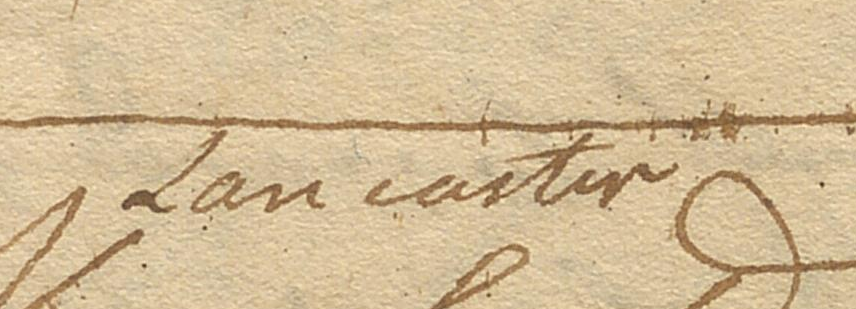Lancaster
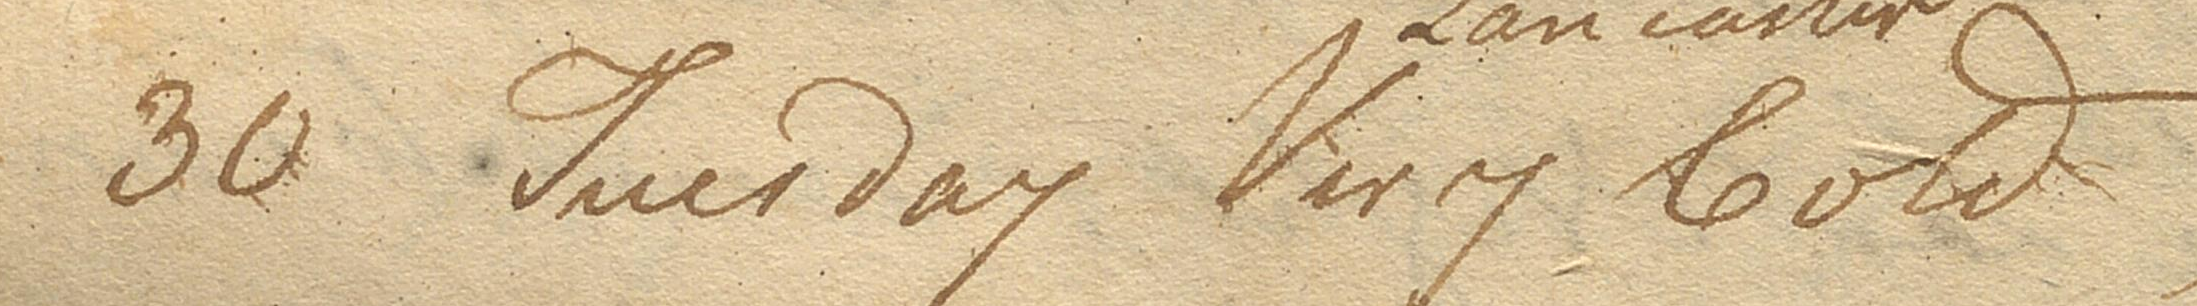30 Tuesday Very Cold
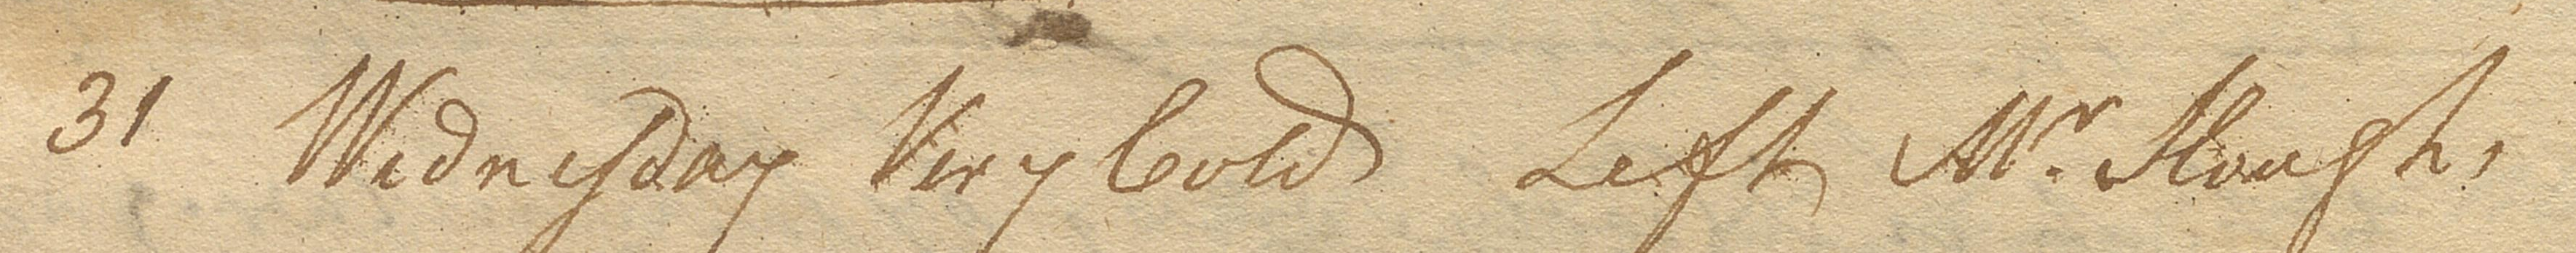31 Wednesday Very Cold Left M^r. Sloughs
